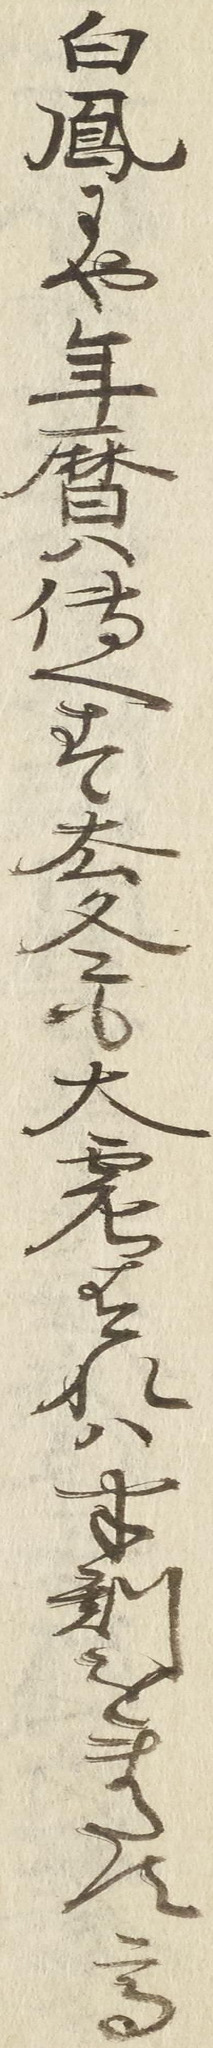白鳳にや年暦は伝へす去冬も大震すれは半刻をまたす高
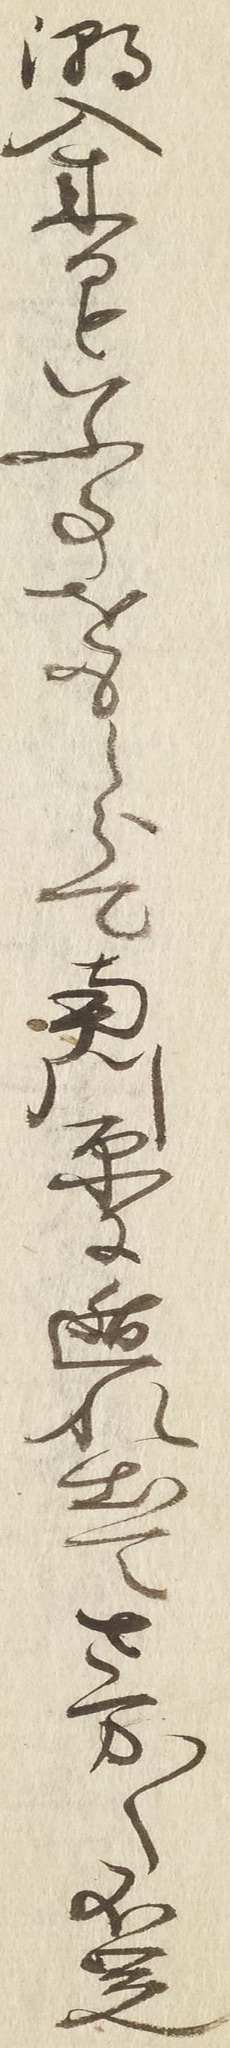潮入来るといふ事をもしらて南川原に遁れ出てさま〳〵不足
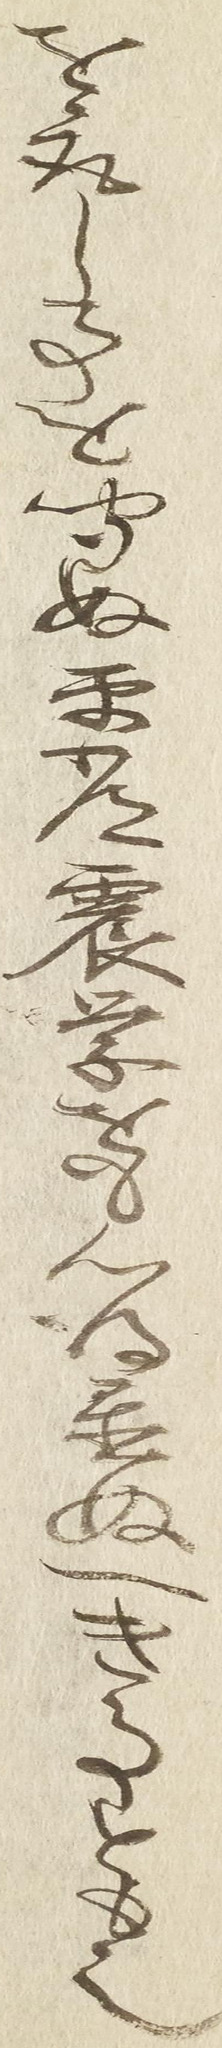を取し事を聞ぬ平常震学をも心得置ぬへき事とも也
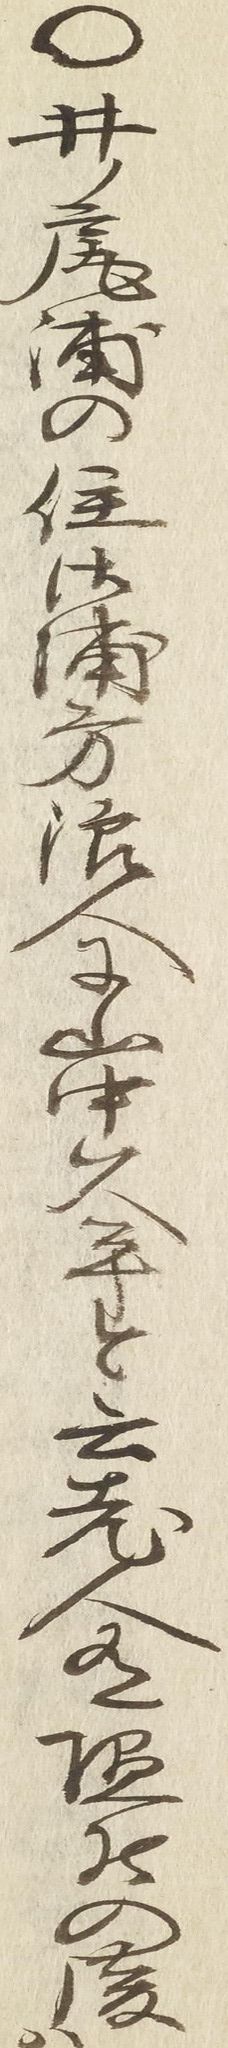〇井の尻浦の住御浦方浪人に山中久平と云老人有隠居の後は
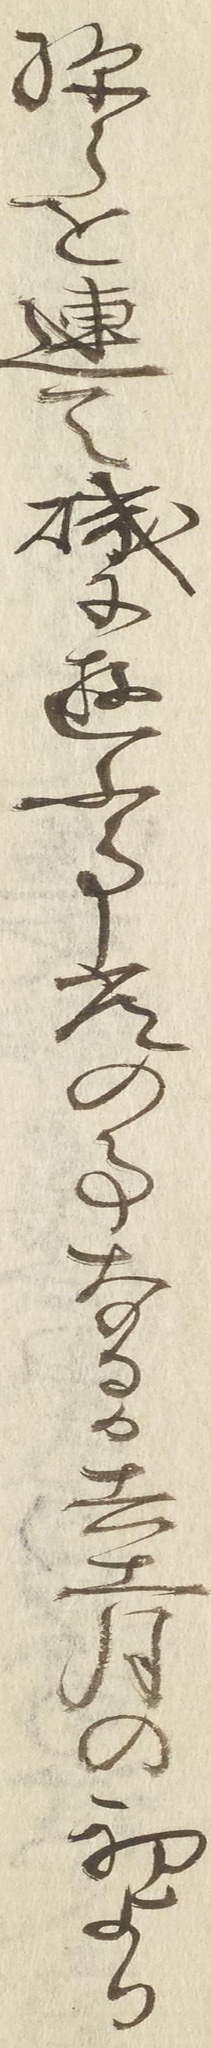孫らを連て磯に遊ふ事常の事なるか去十一月の初より
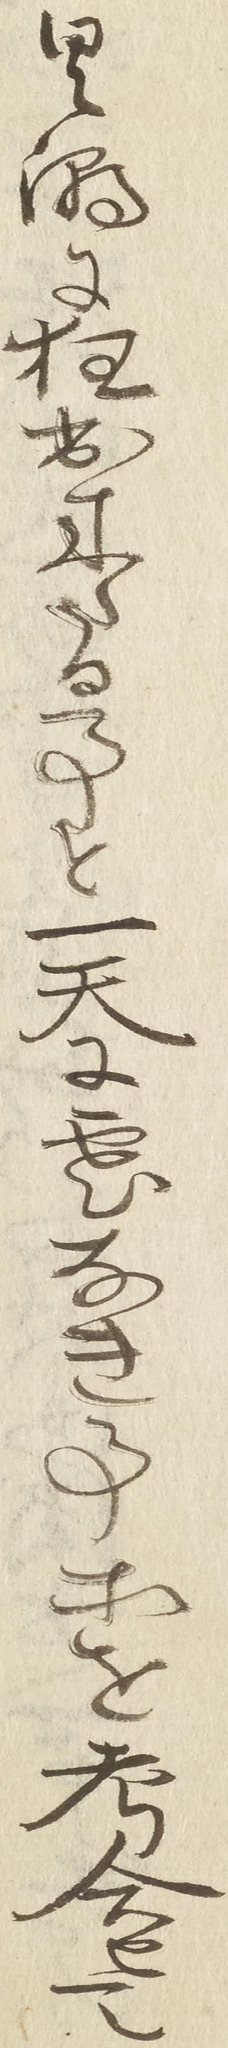日々潮に狂出来たる事と一天に雲なき事等を考合せて
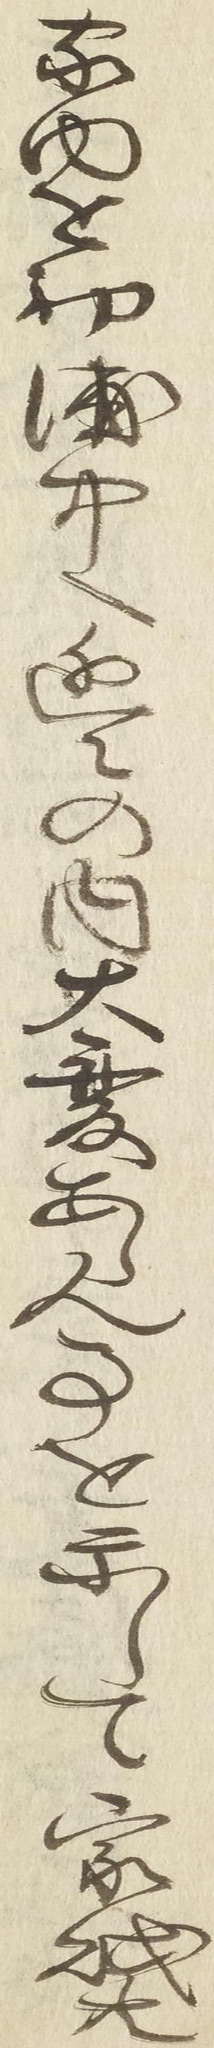家内を初浦中へ近々の内大変あらん事を示して家財共
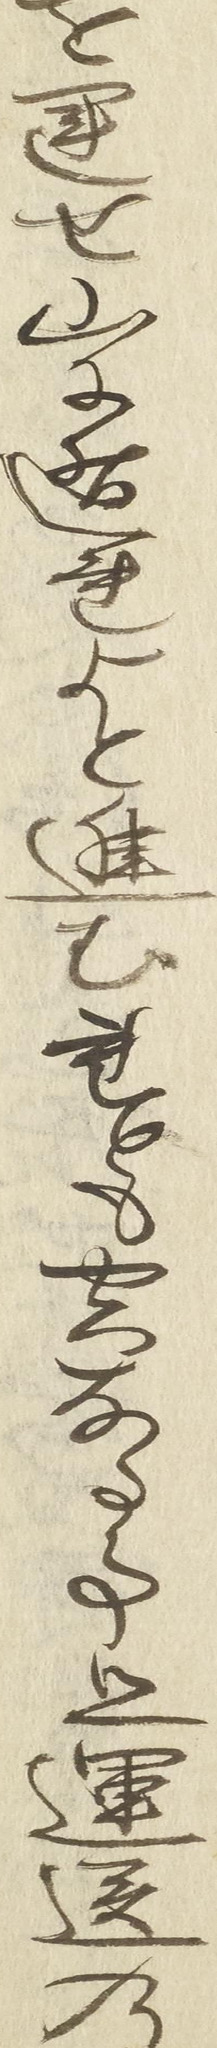を運せ山に遁れよと進むれとも空なる事且運送の
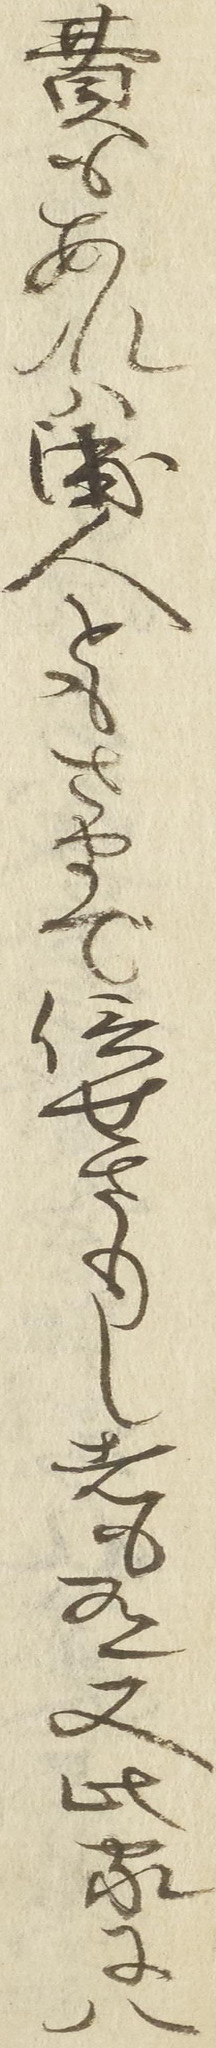費もあれは浦人ともさまで信せさりし者も有又此家には

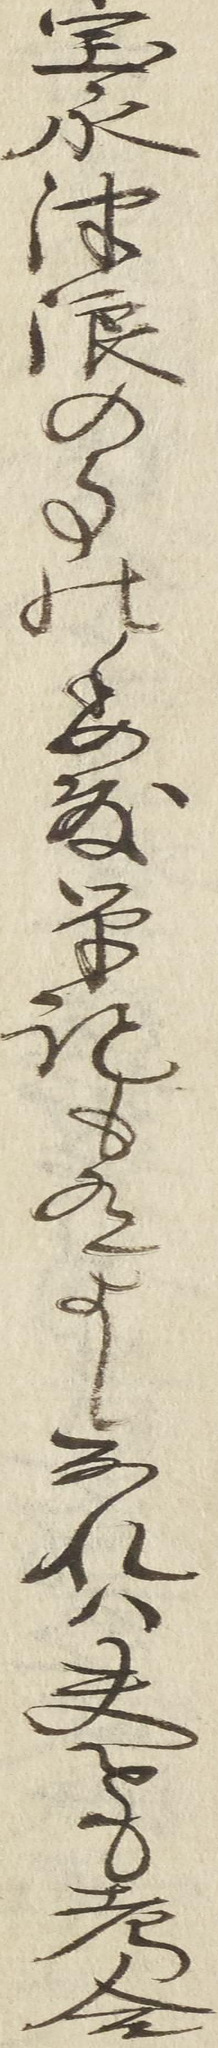宝永津浪の事の委敷筆記も有よしなれは夫をも考合
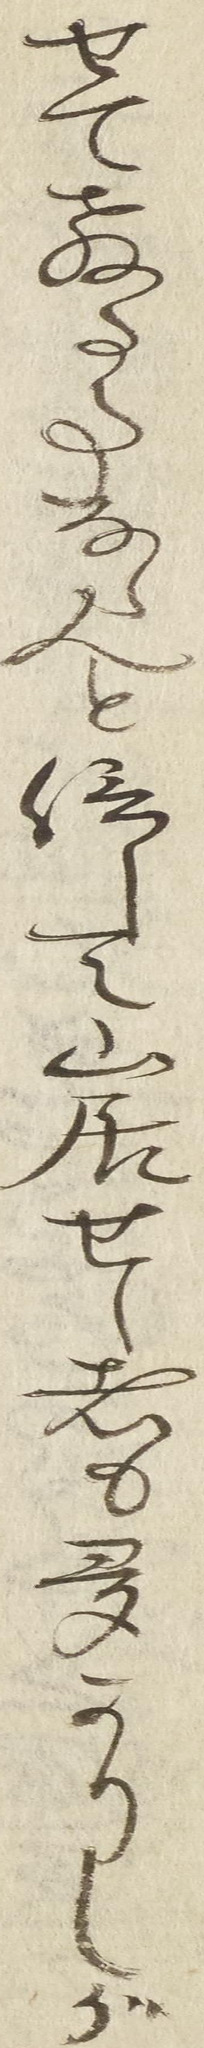せて教る事ならんと信じて山居せし者も多かりしが
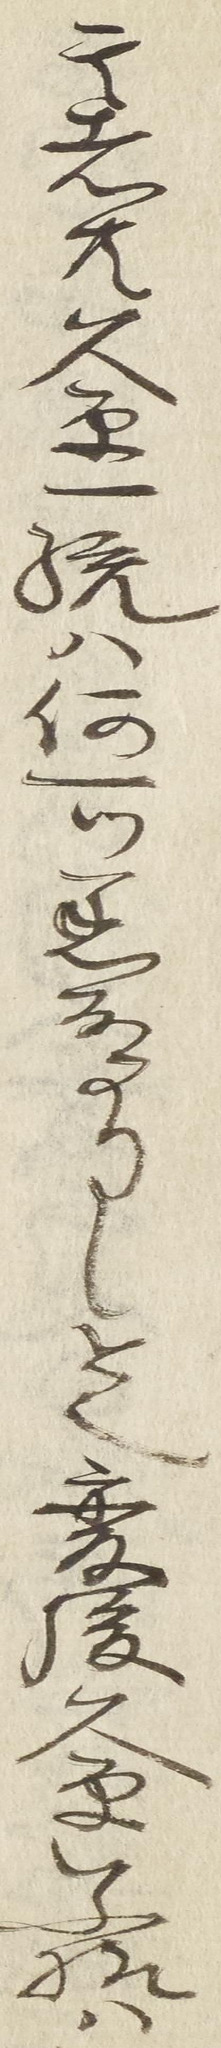其者共久平一統は何一つ恙なかりしと也変後久平いふ様は
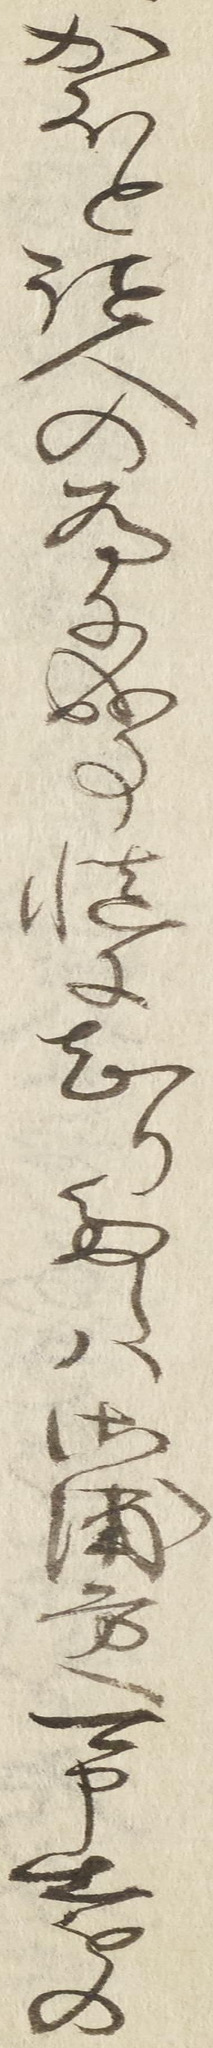かほと諸人の為に成事慥に知りたしは御浦方へ可申出もの
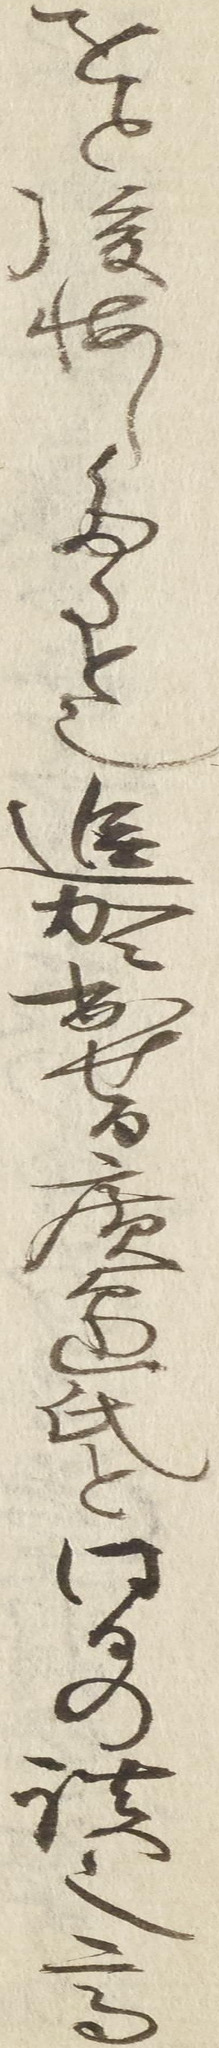をと後悔したると也追加に出せる広島氏と同日の談也高
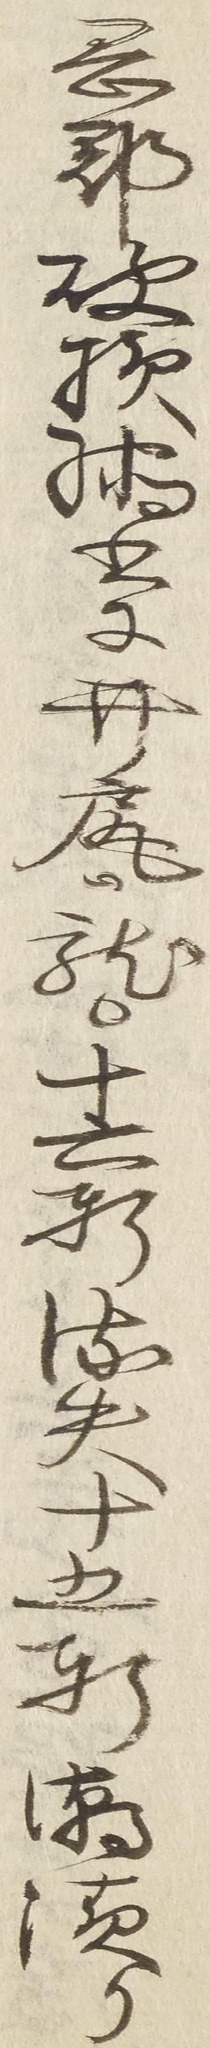岡郡破損偽書に井の尻か就◦十六軒流失十五軒潮漬り
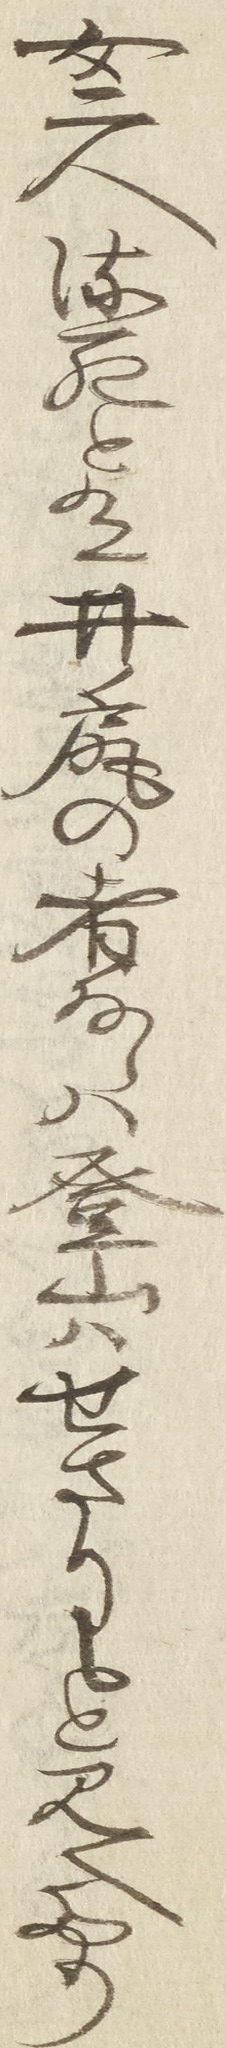女二人流失と有井の尻の者ならは登山はせさりしと見へたり
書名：地震記　上
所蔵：東京大学地震研究所図書室 Earthquake Research Institute Library, The University of Tokyo, JAPAN
